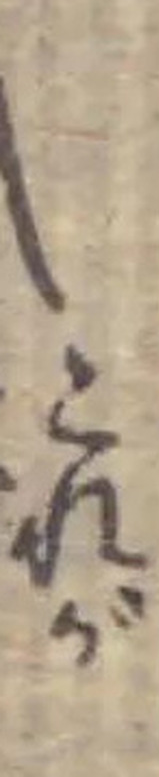これが
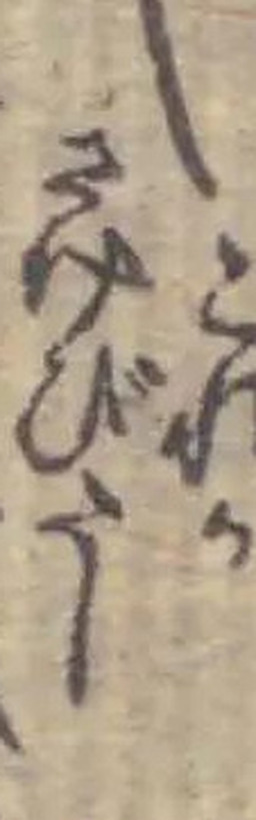さけびたし

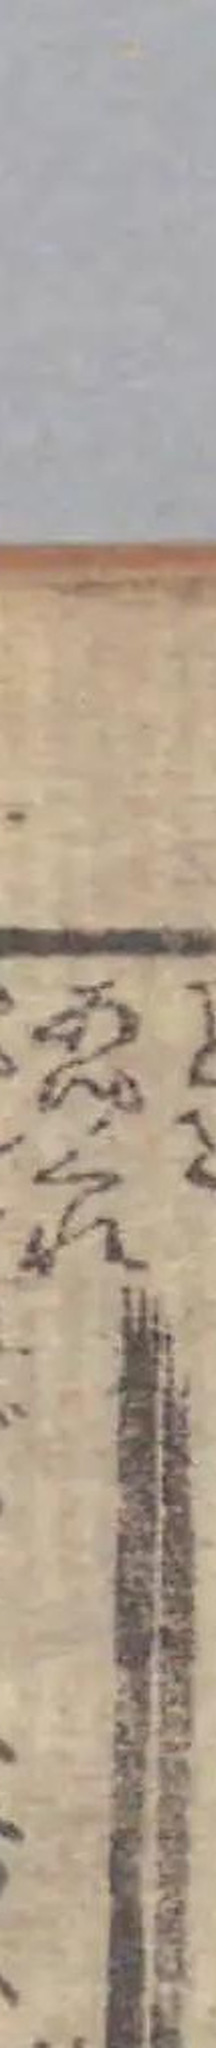あけくれ
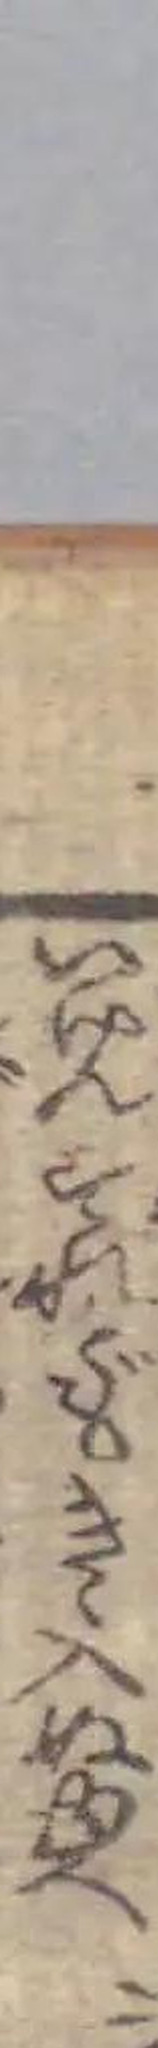いけんすれどもきゝ入ぬゆへ
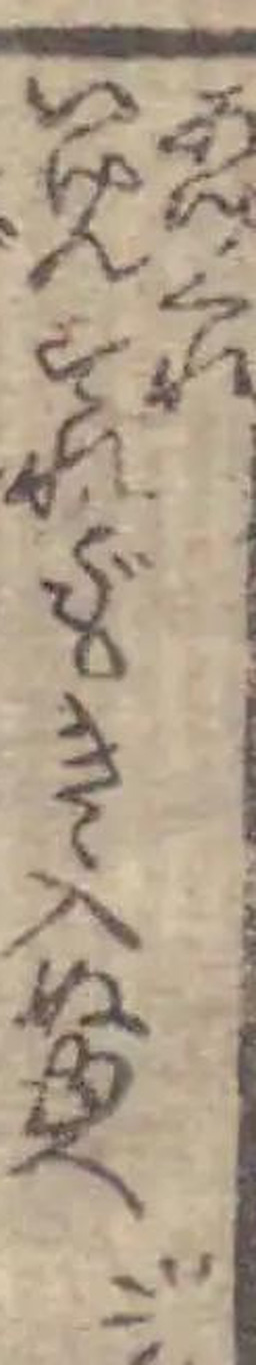いけんすれどもきゝ入ぬゆへ
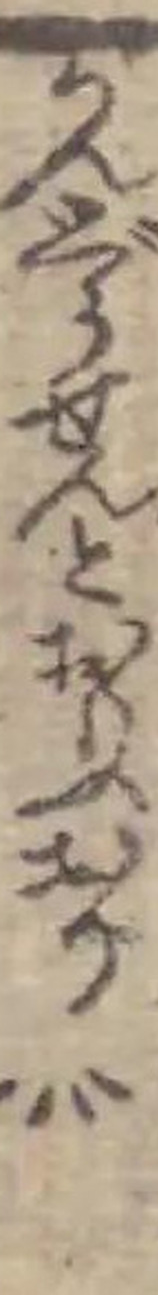かんどうせんとおもふおり
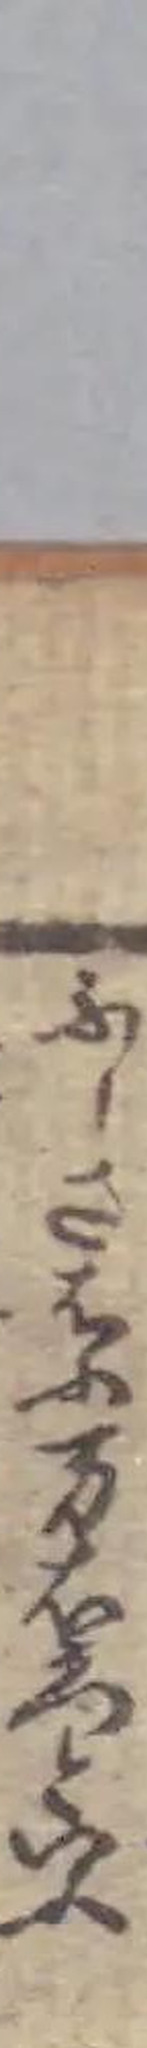ふしさはに万右衛門といふ
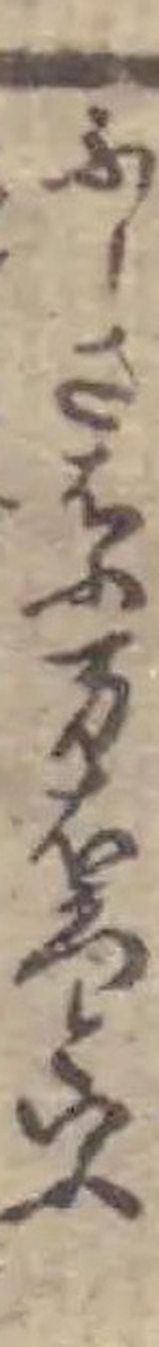ふしさはに万右衛門といふ
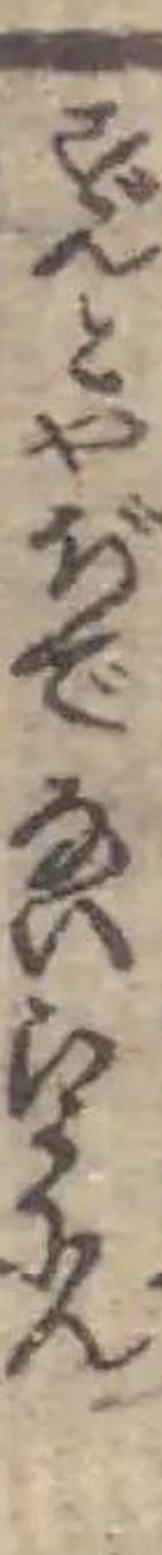ずんとやぼでないらうにん
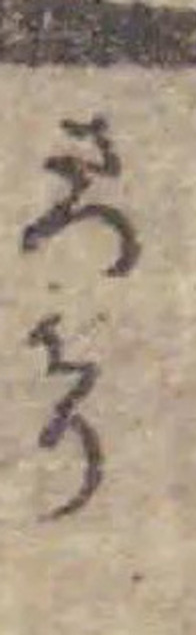さつはり
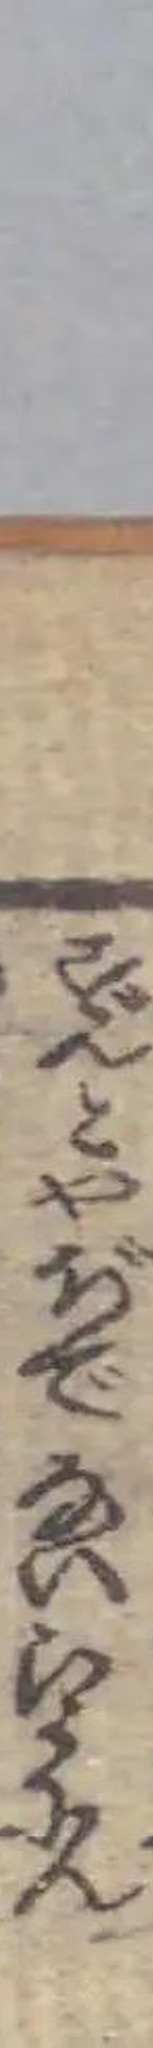ずんとやぼでないらうにん
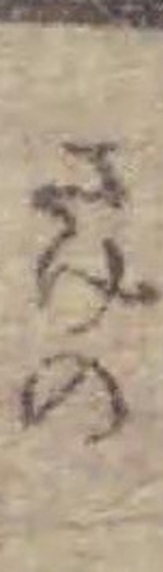さけの
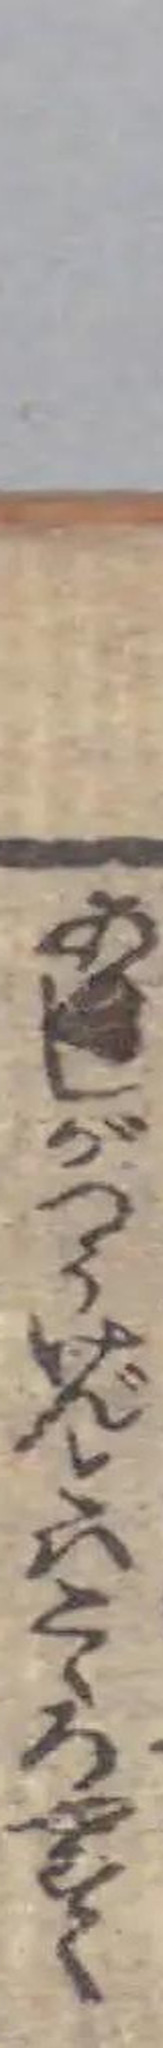ありしがつうげんとはこゝろやすく
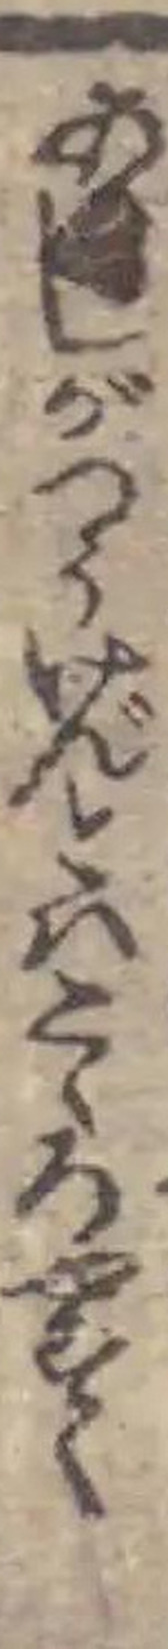ありしがつうげんとはこゝろやすく
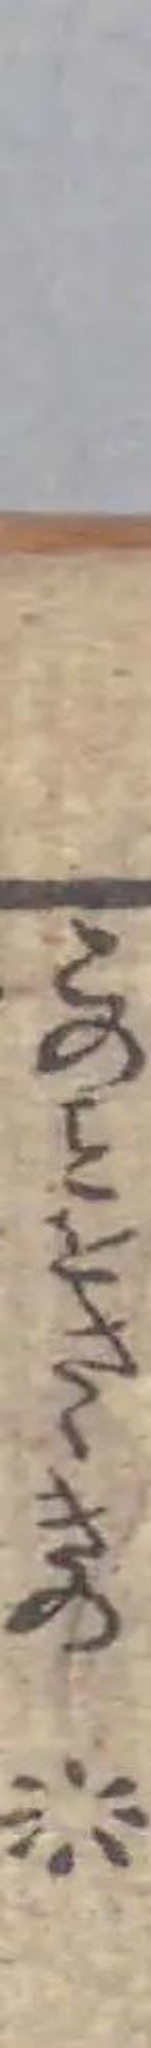このことをきゝきの
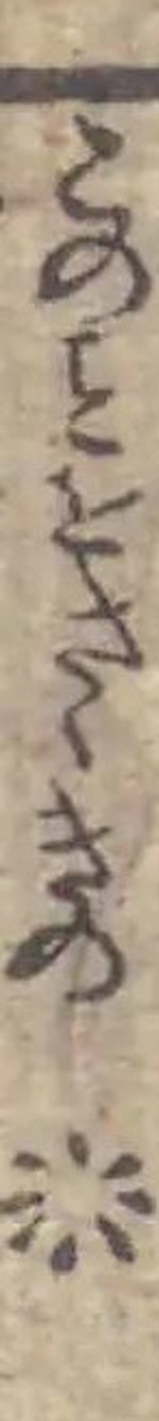このことをきゝきの
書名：飲中八人前 3巻
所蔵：国立国会図書館 National Diet Library, JAPAN
